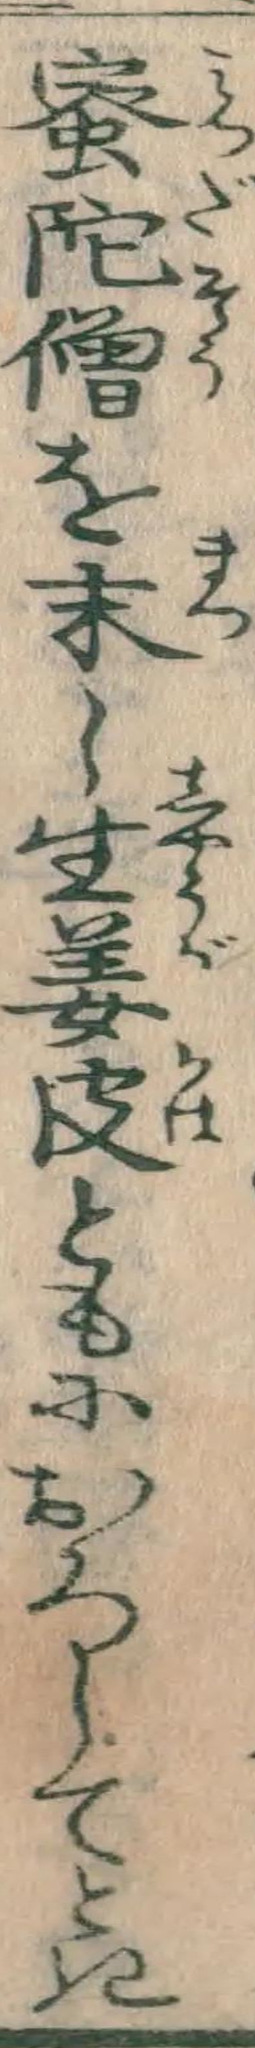蜜陀僧を末し生姜皮ともにおろしてとき
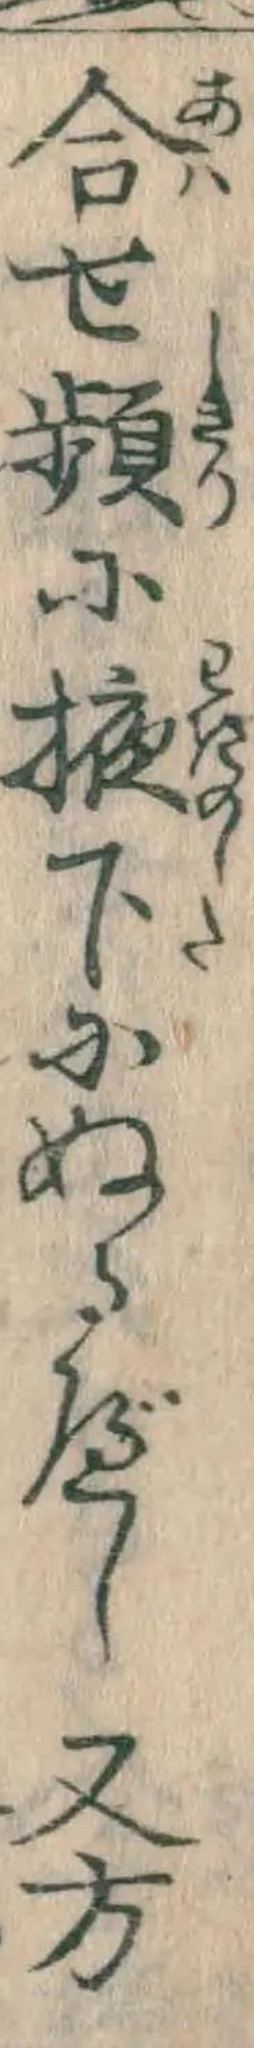合せ頻に掖下にぬるべし又方

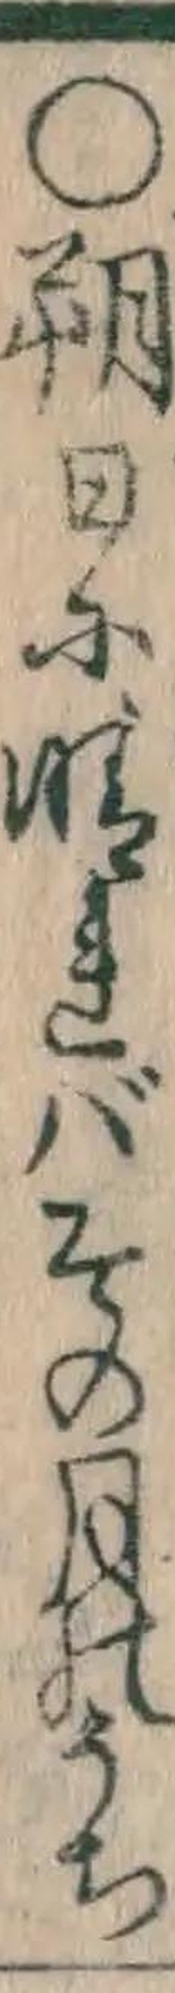○朔日に晴ればその月のうち
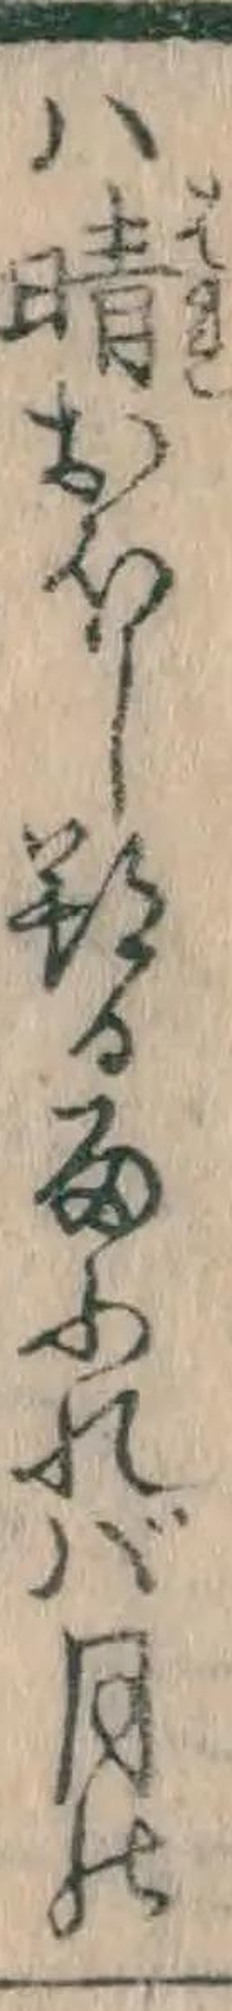は晴おほし朔日雨ふれば月の
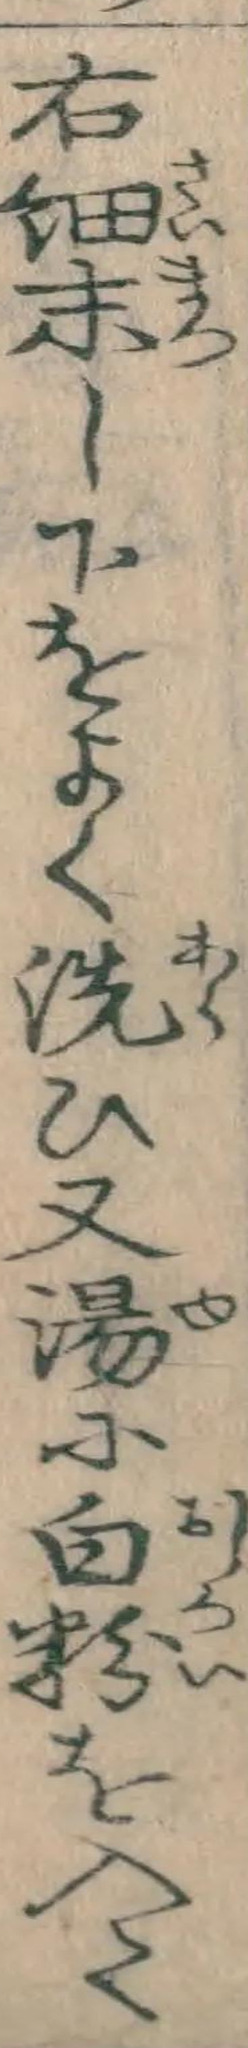右細末し下をよく洗ひ又湯に白粉を入て
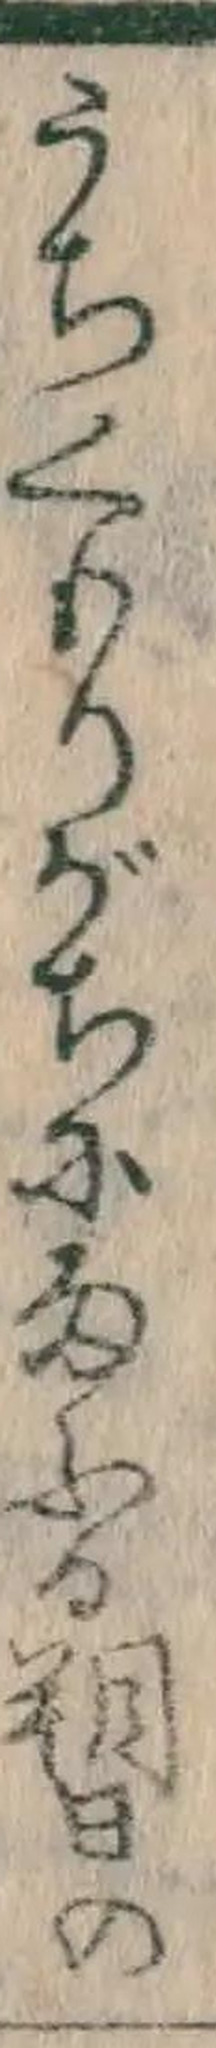うちくもりがちに雨ふる朔日の
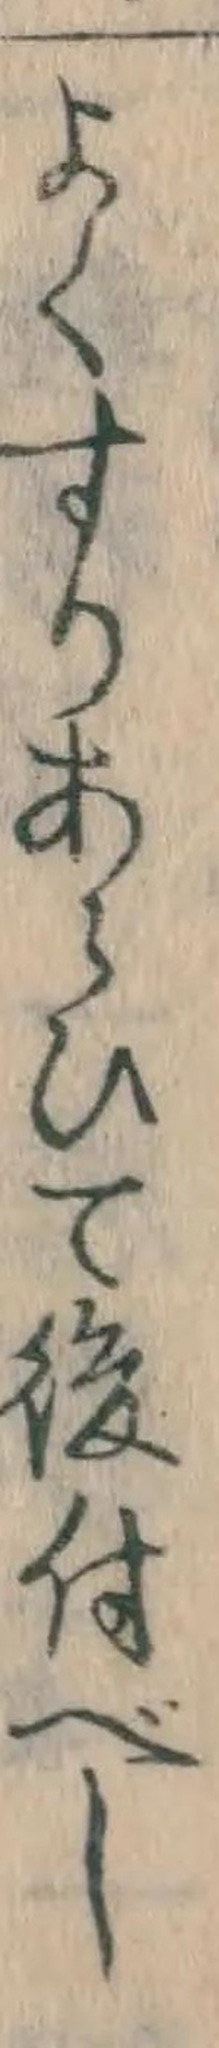よくすりあらひて後付べし
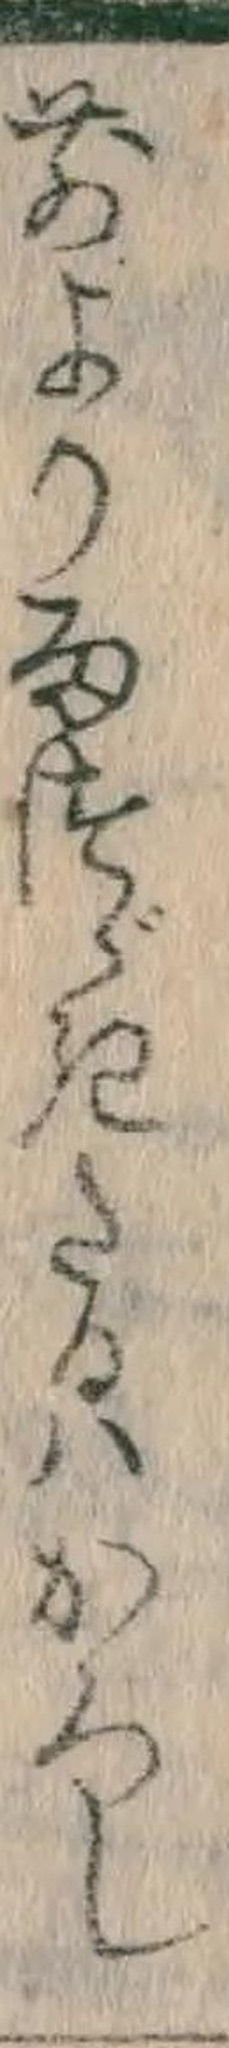前より雨つゞきたるはかろし
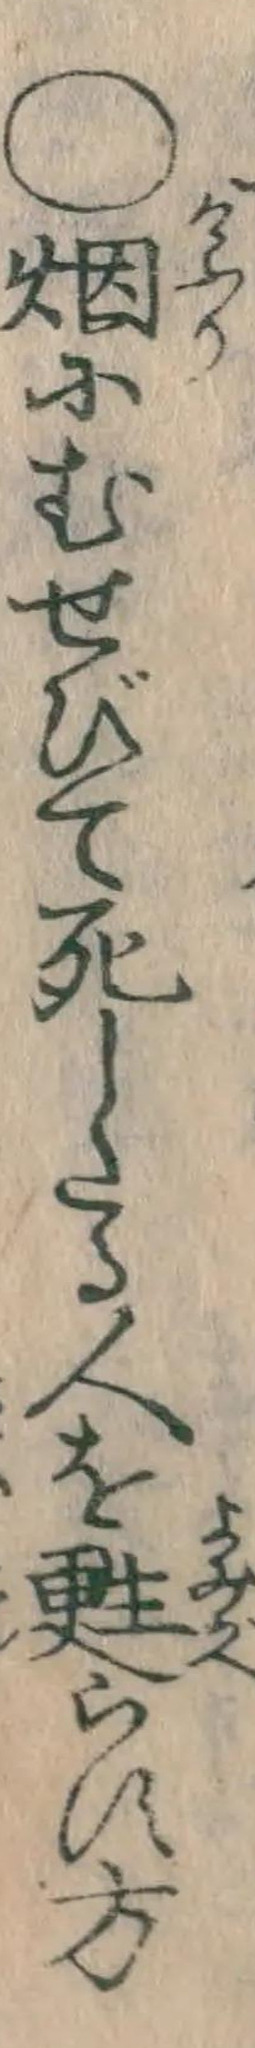○煙にむせびて死したる人を甦らす方
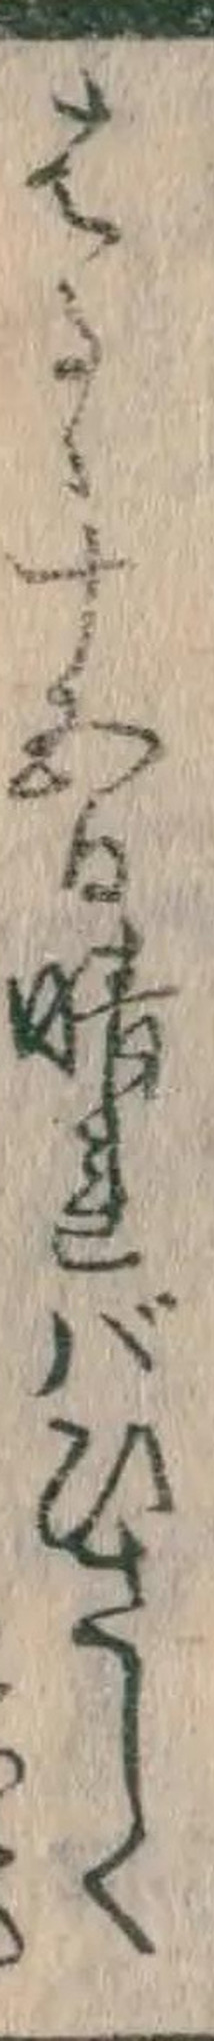はるゝ十五日晴ればひさしく
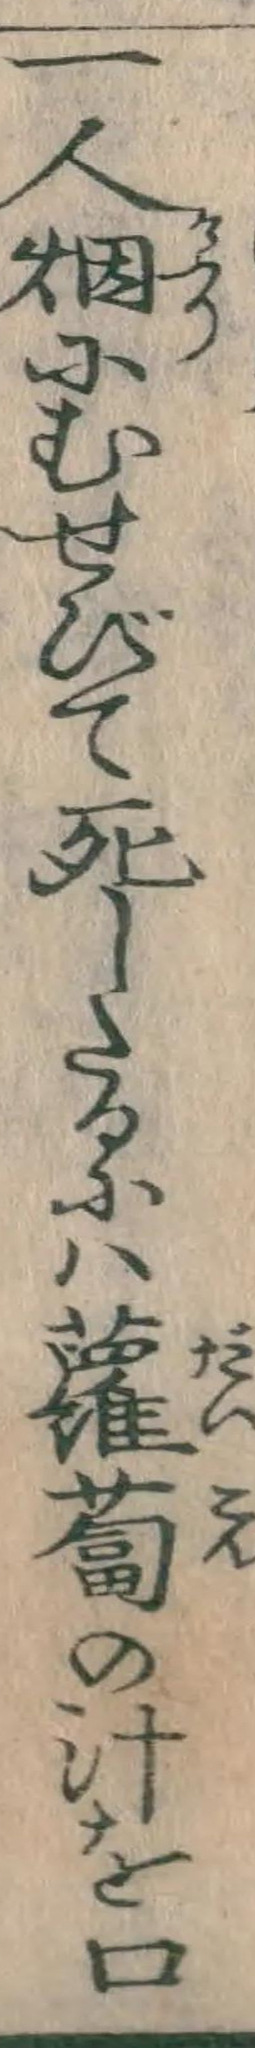一人煙にむせびて死したるには蘿蔔の汁を口
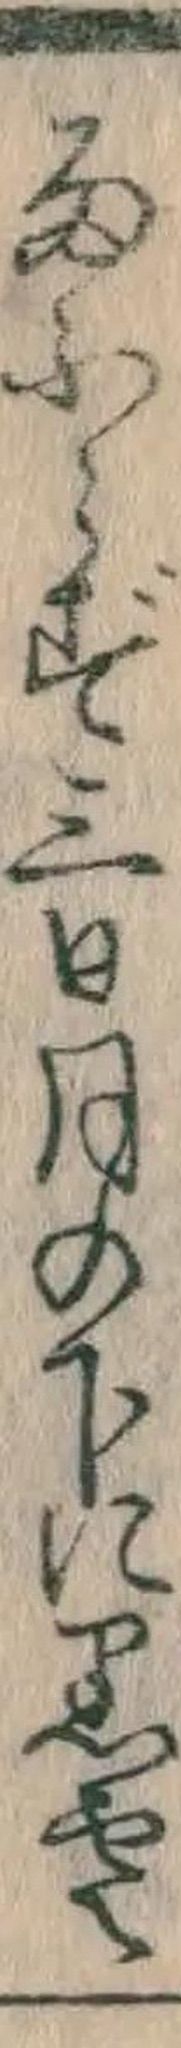雨ふらず三日月の下に黒雲
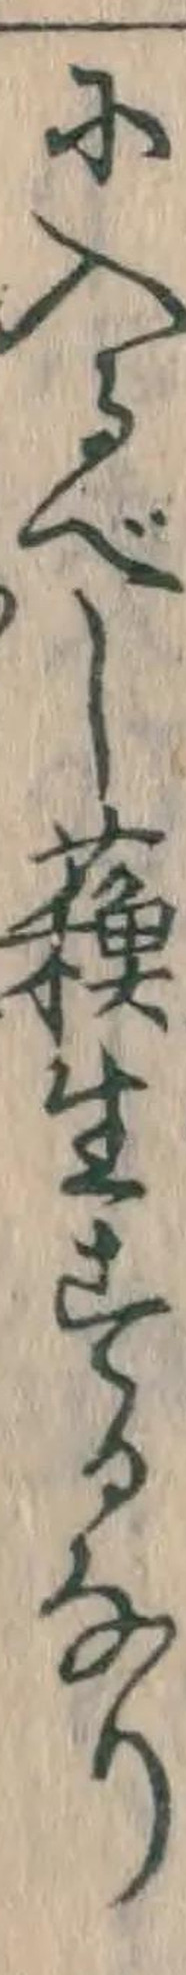に入るべし蘇生するなり
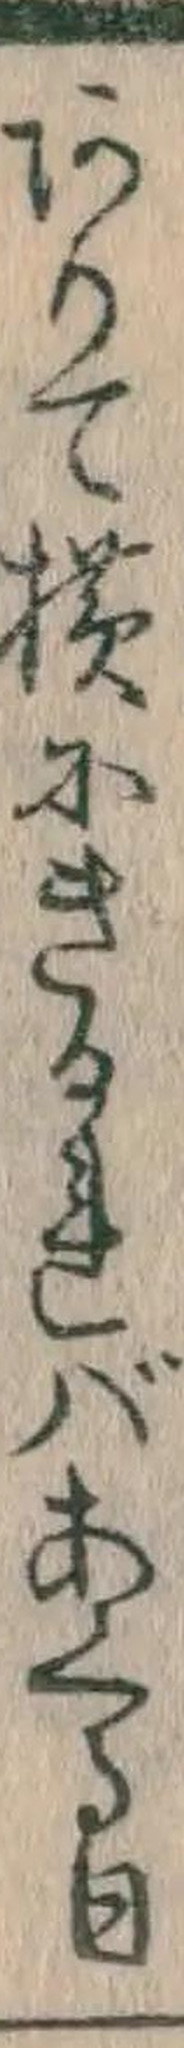ありて横にきるればあくる日
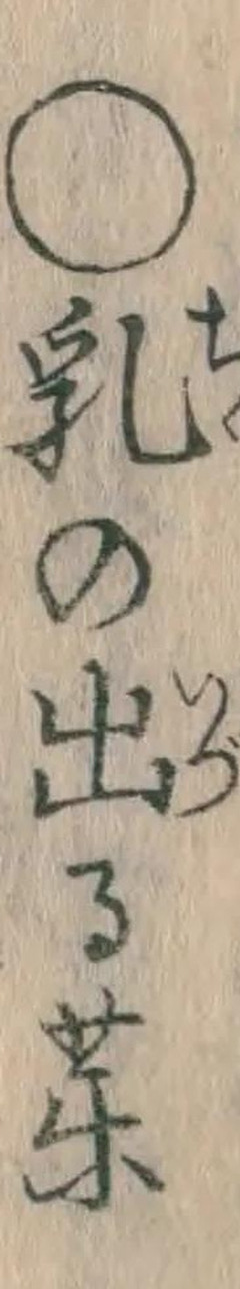○乳の出る薬
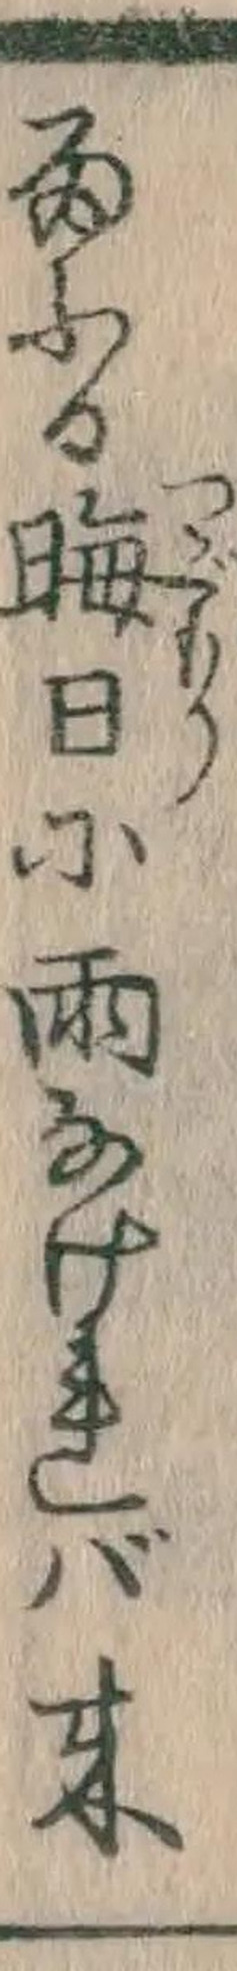雨ふる晦日に雨なければ来
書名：広益秘事大全 3巻. [4]
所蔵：国立国会図書館 National Diet Library, JAPAN
